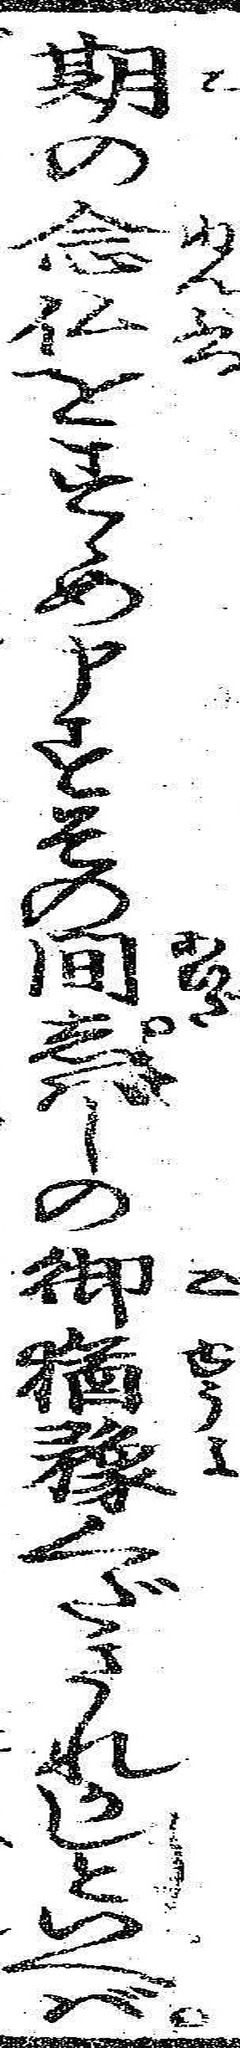期の念仏をすゝめ申すその間。しばしの御猶予くだされかしといへば。
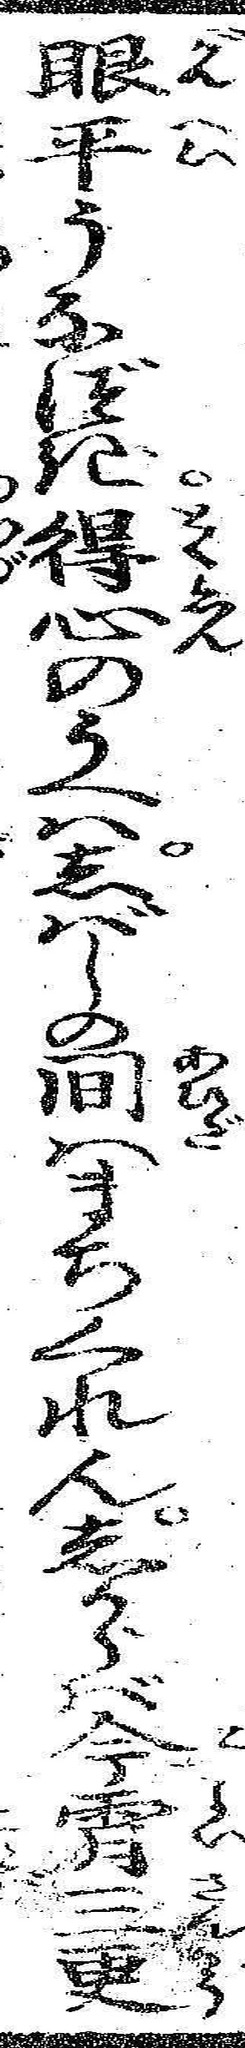眼平うなづき。得心のうへは。しばしの間はまちくれん。しからば今宵三更
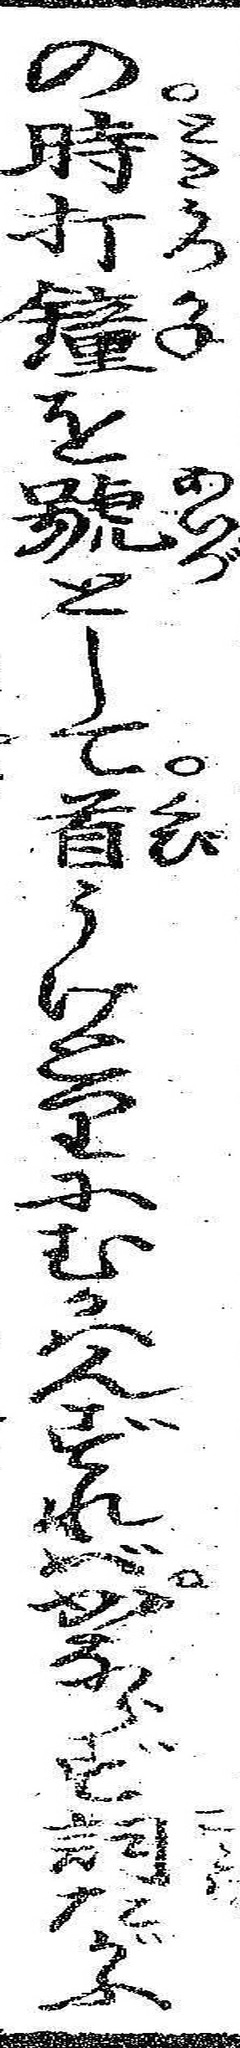の。時打鐘を号として。首うけとりにむかはんずれば。かならず詞たがふ
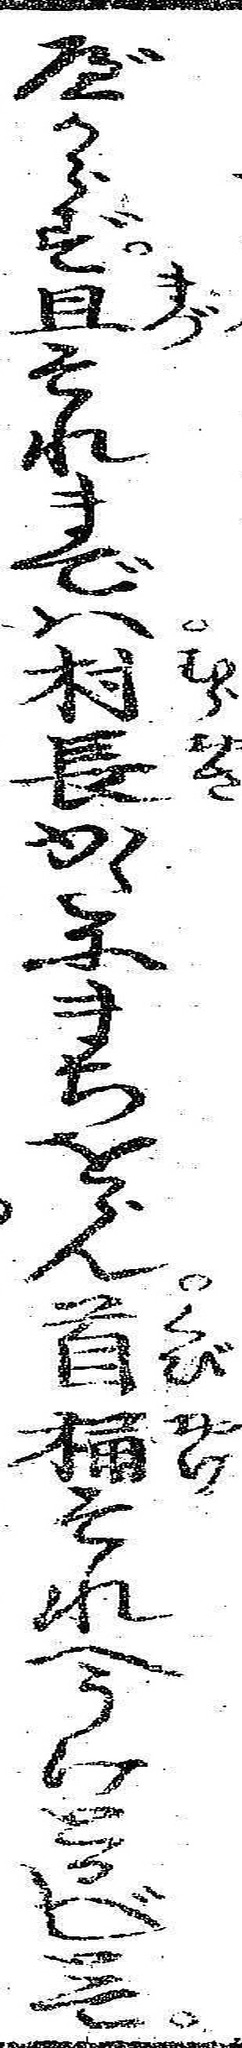べからず。且それまでは。村長かたにまちをらん。首桶それへうけとるしべとて。
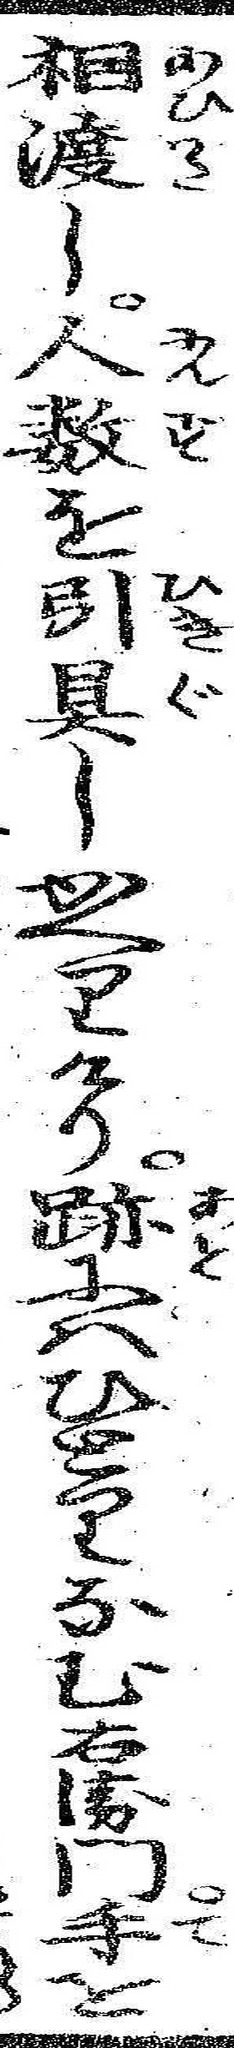相渡し。人数を引具しかへりけり。跡にはひとりなむ右衛門。手を
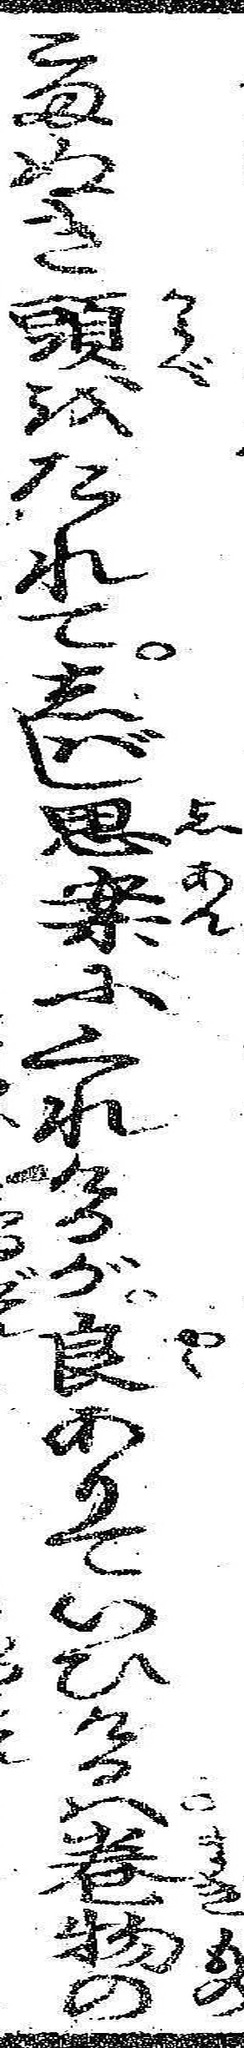こまぬき頭をたれて。しばし思案にくれけるが。良ありていひけるは。巻物の
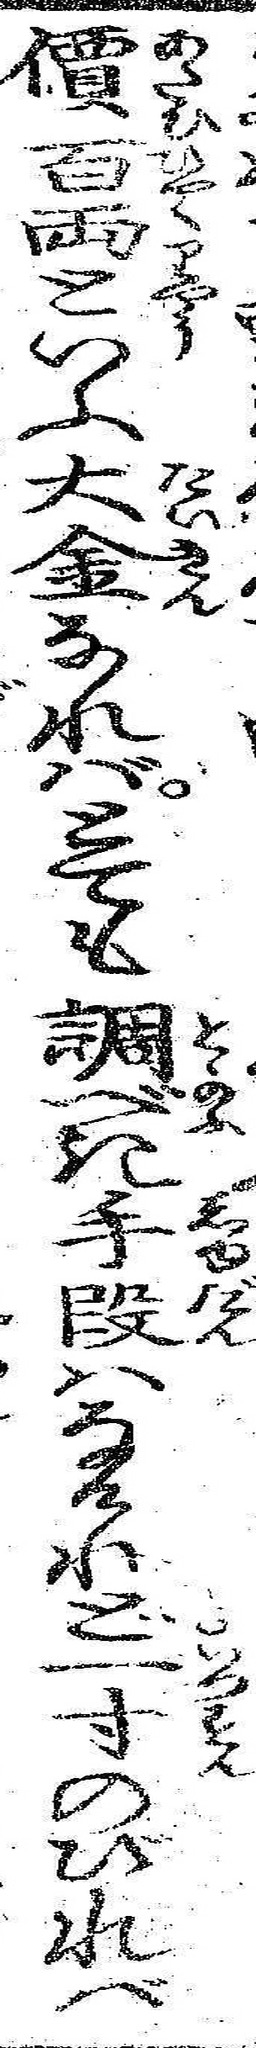価百両といふ大金なれば。とても調べき手段はなけれど。一寸のびれば
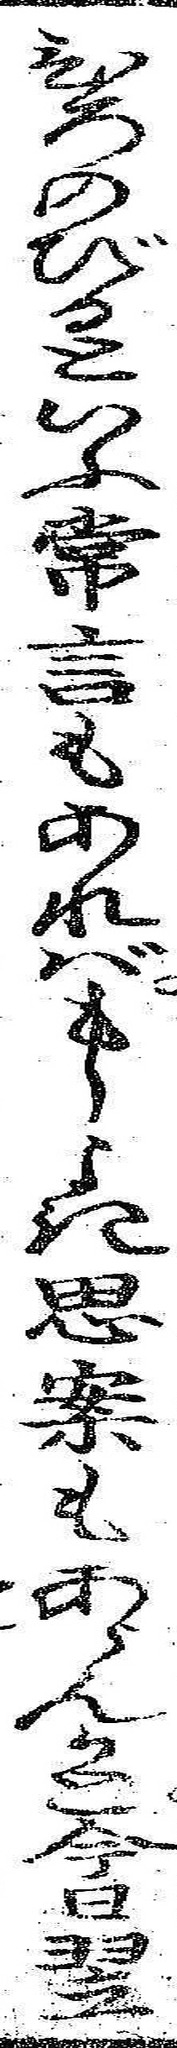ひろのびるといふ。常言もあれば。もしよき思案もあらんかと。今日翌
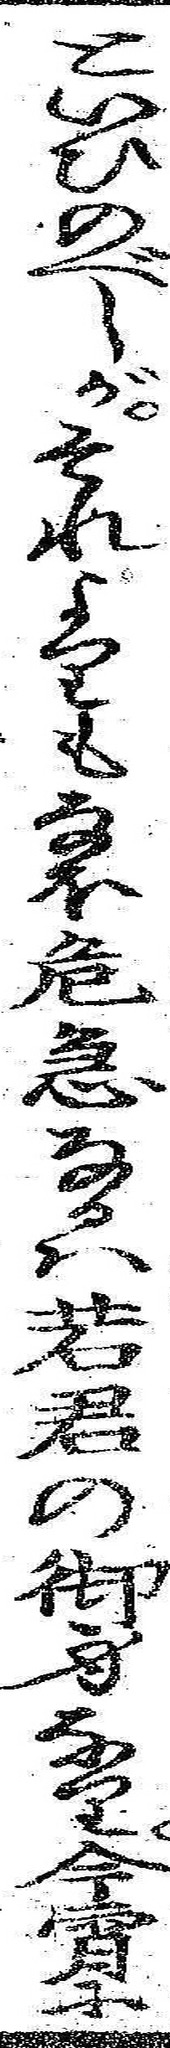といひのべしが。それよりもなほ危急なるは。若君の御身なり。今宵に

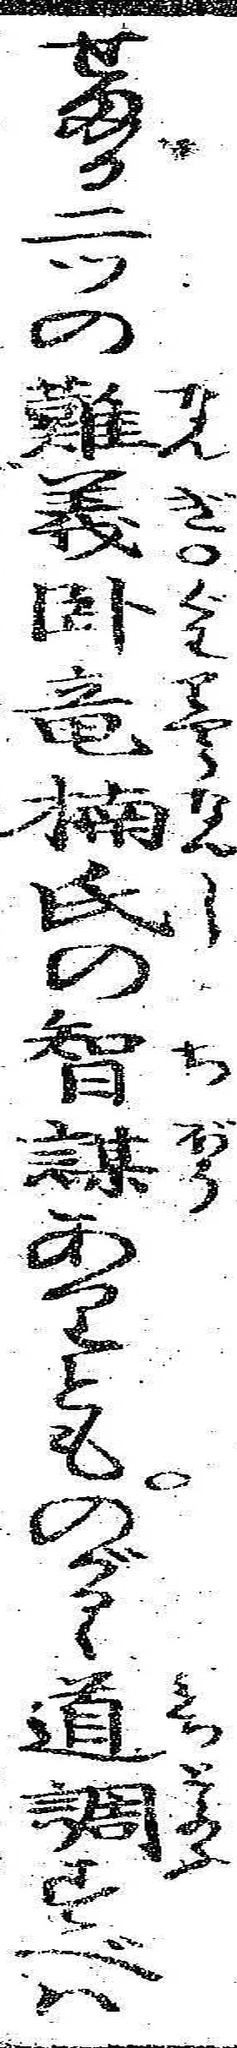せまる二ツの難義。臥竜楠氏の智謀ありとも。のがるゝ道調すべは
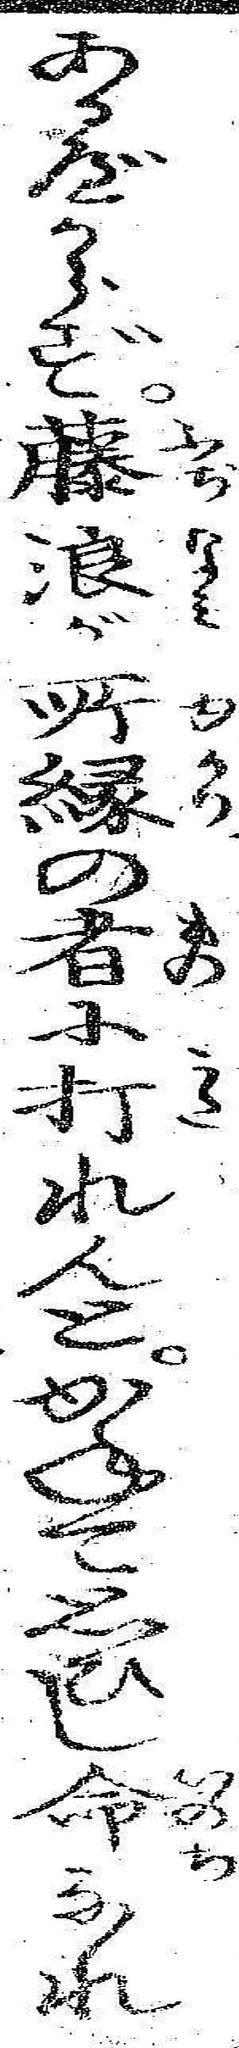あるべからず。藤浪が所縁の者に打れんと。かねて思ひし命なれ
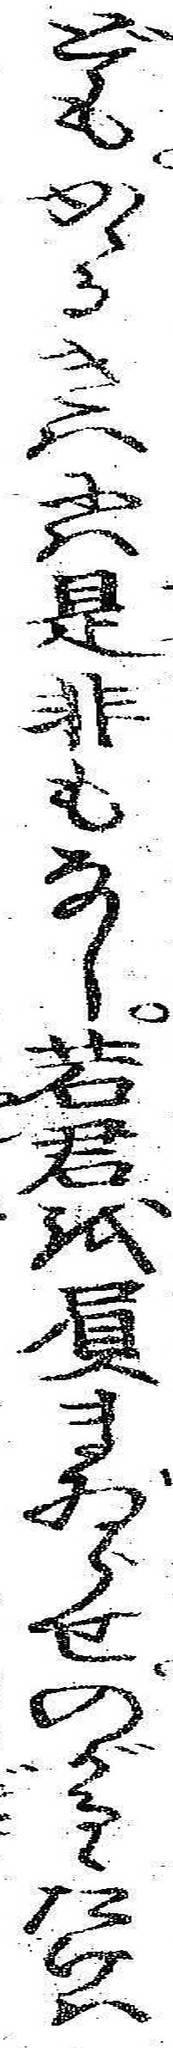ども。かゝるきはには是非もなし。若君を屓まゐらせ。のがるゝたけは
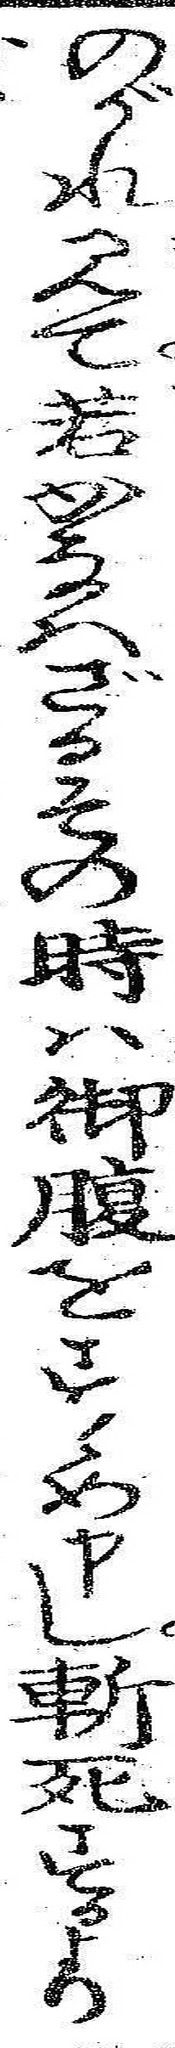のがれ見て。若かなはざるその時は。御腹をすゝめ申し。斬死するより
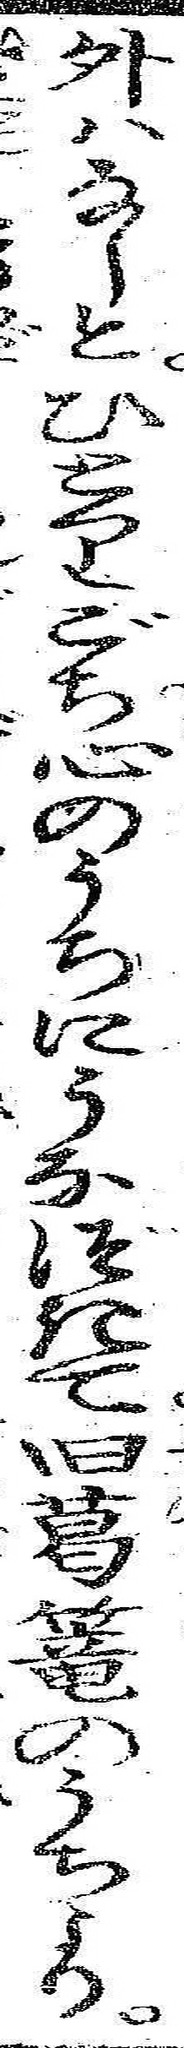外はなしと。ひとりごち。心のうちにうなづきて。旧葛篭のうちより。
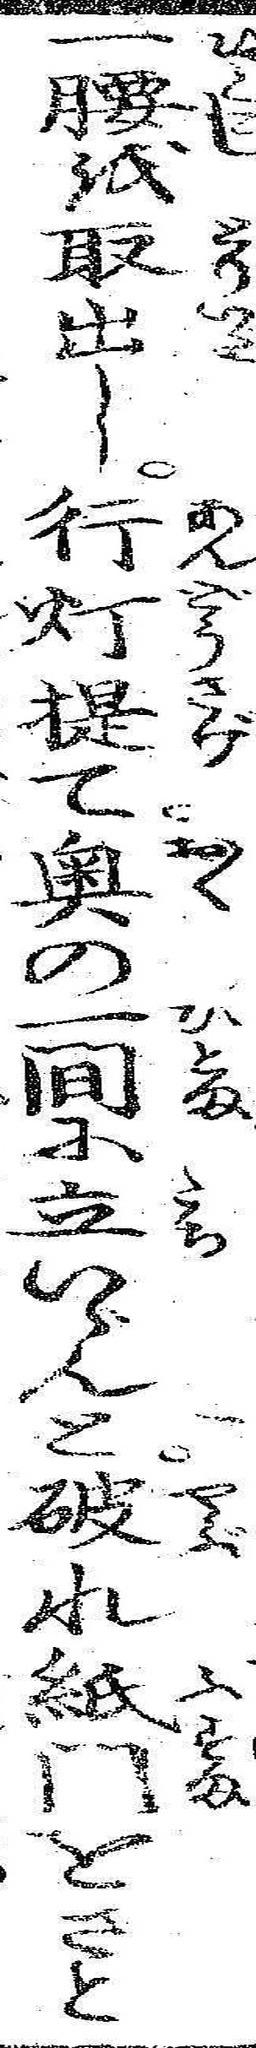一腰を取出し。行灯提て。奥の一間に立いらんと。破れ紙門をさと
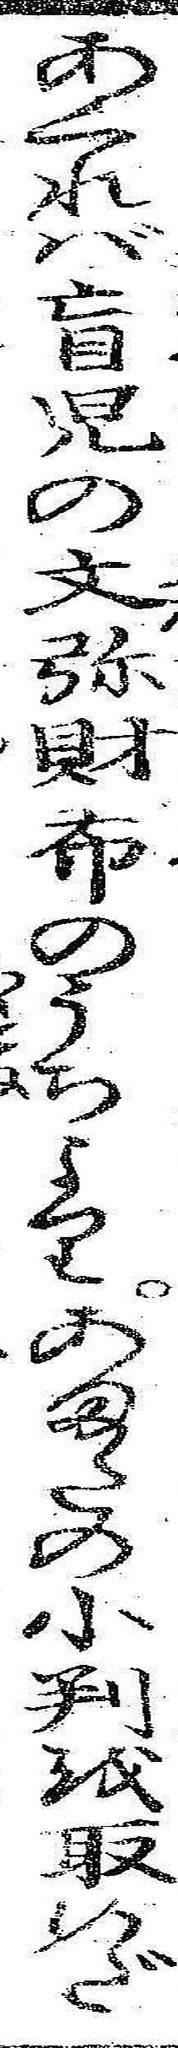あくれば。盲児の文弥。財布のうちより。あまたの小判を取いだ
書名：昔話稲妻表紙
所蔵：国文学研究資料館
